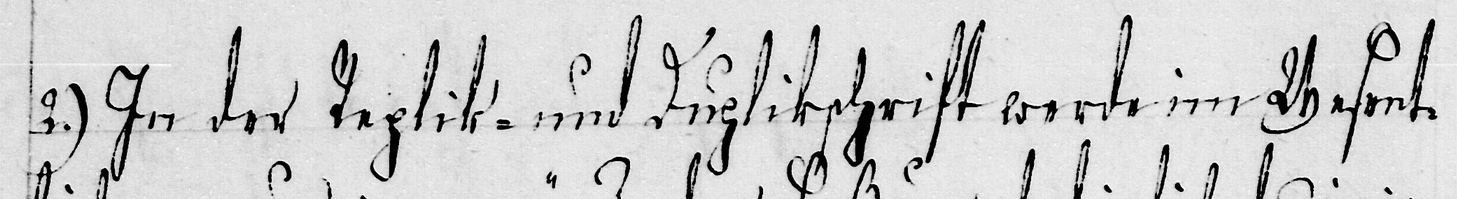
2.) In der Replik- und Duplikschrift werde im Wesen¬
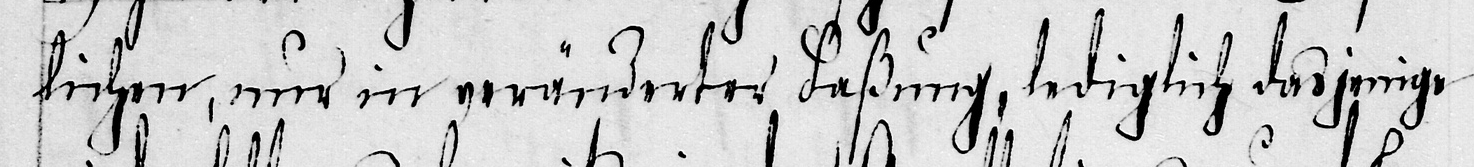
tlichen, nur in veränderter Faßung, lediglich dasjenige
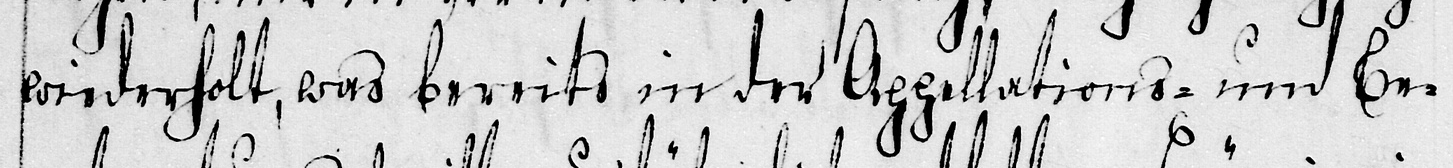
wiederholt, was bereits in der Appellations- und Be¬
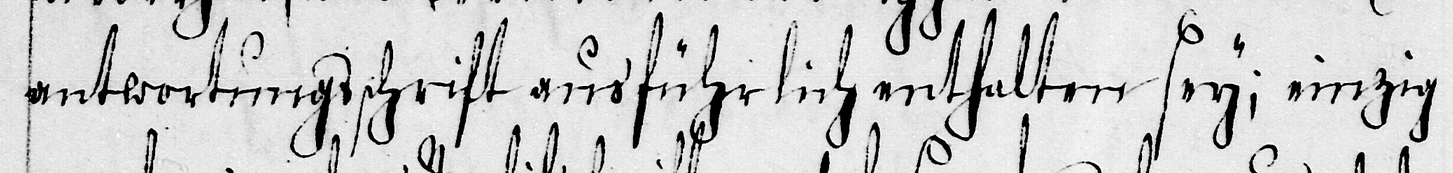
antwortungsschrift ausführlich enthalten sey; einzig
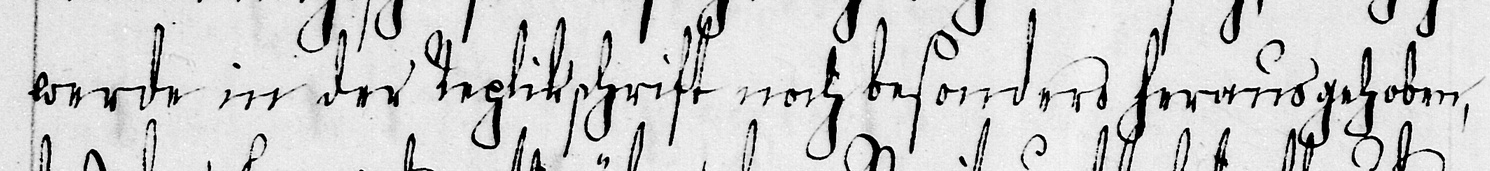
werde in der Replikschrift noch besonders herausgehoben,
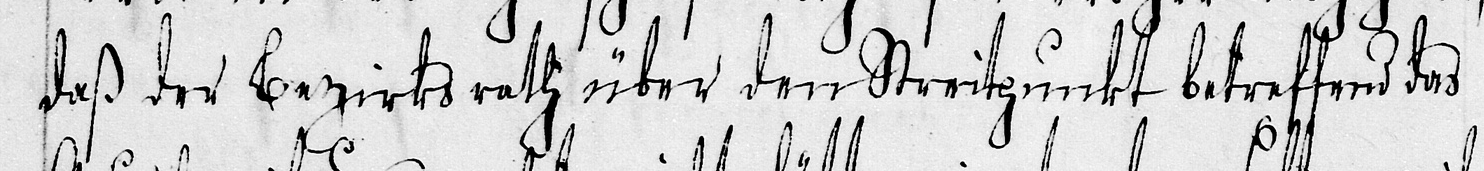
daß der Bezirksrath über den Streitpunkt betreffend das
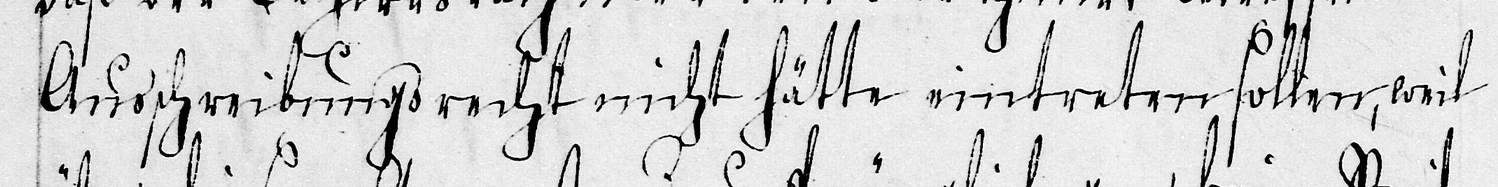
Ausschreibungsrecht nicht hätte eintreten sollen, weil
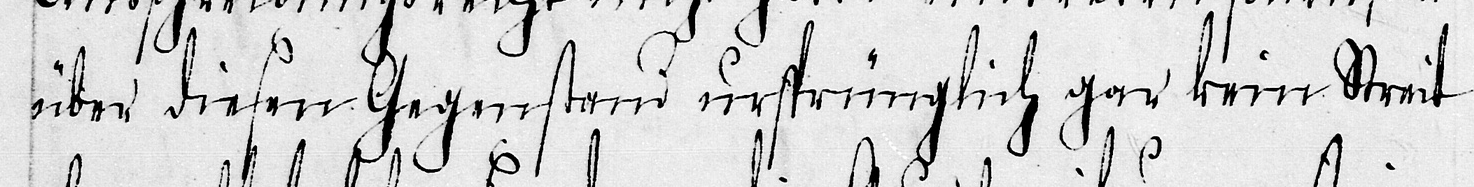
über diesen Gegenstand ursprünglich gar kein Streit
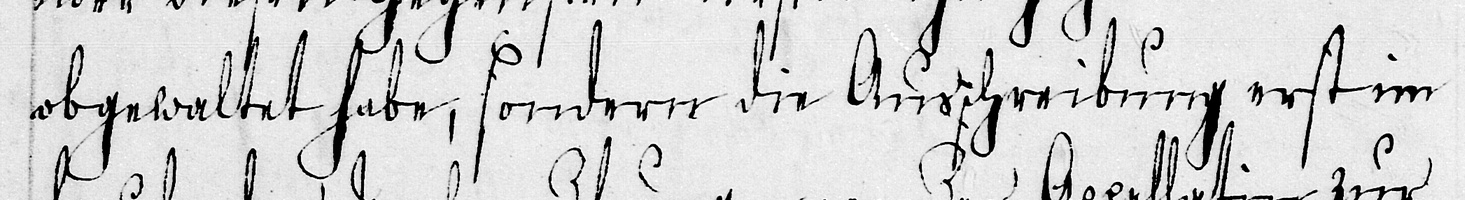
obgewaltet habe, sondern die Ausschreibung erst im
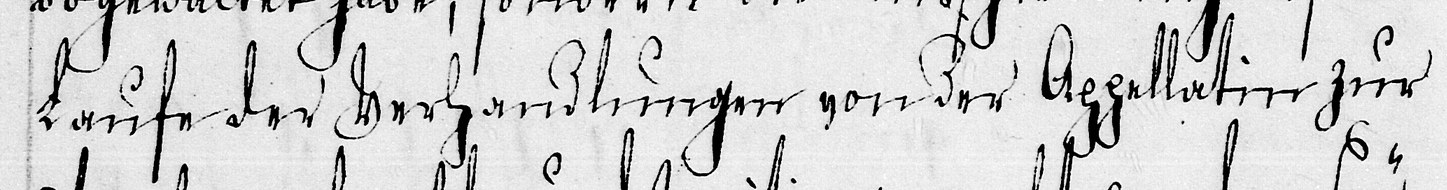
Laufe der Verhandlungen von der Appellatin zur
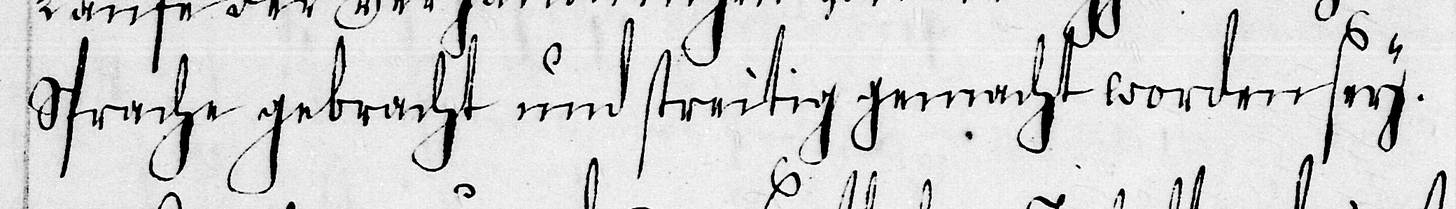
Sprache gebracht und streitig gemacht worden sey.
